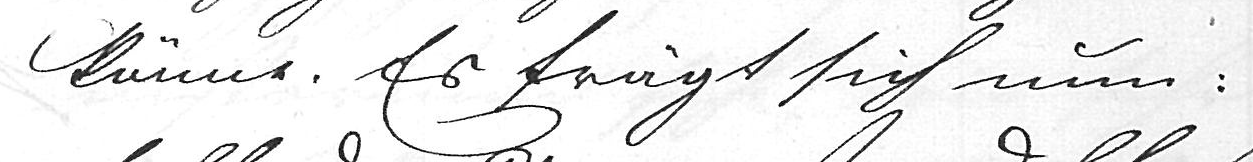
könne. Es frägt sich nun:
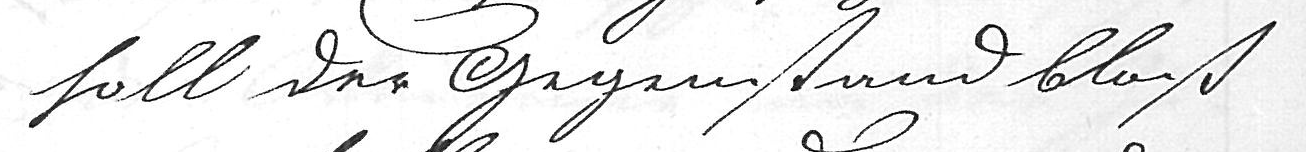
soll der Gegenstand bloß
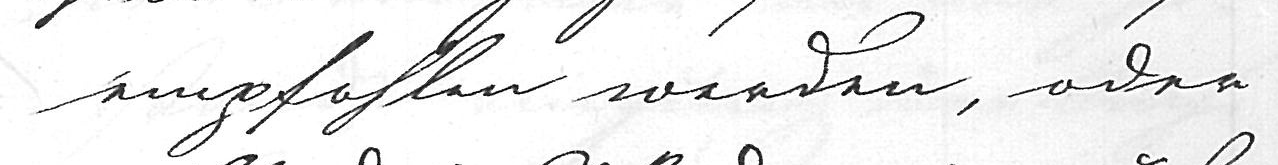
empfohlen werden, oder
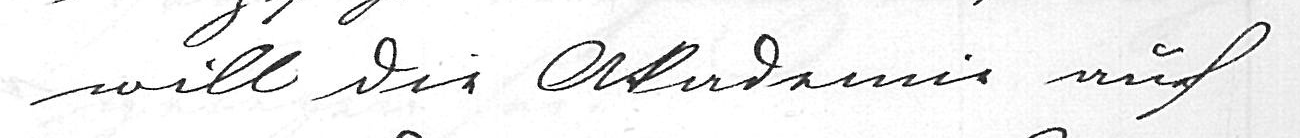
will die Akademie auf
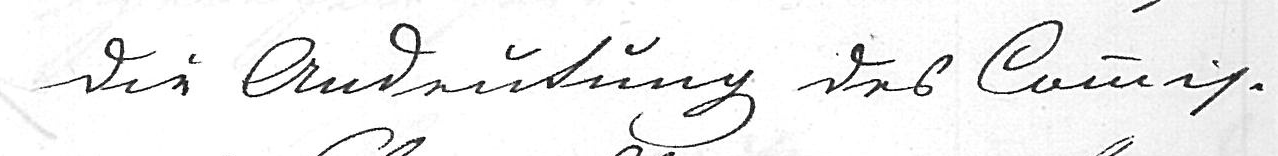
die Andeutung des Commis-
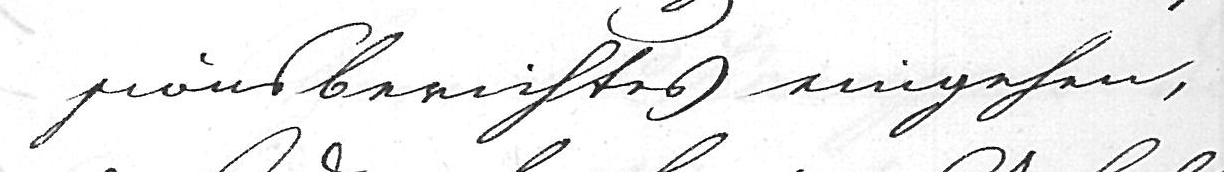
sionsberichtes eingehen,
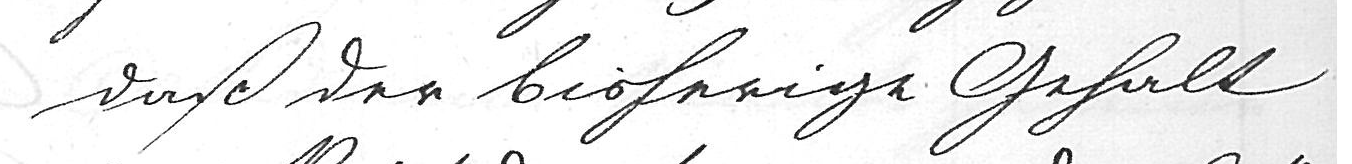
daß der bisherige Gehalt
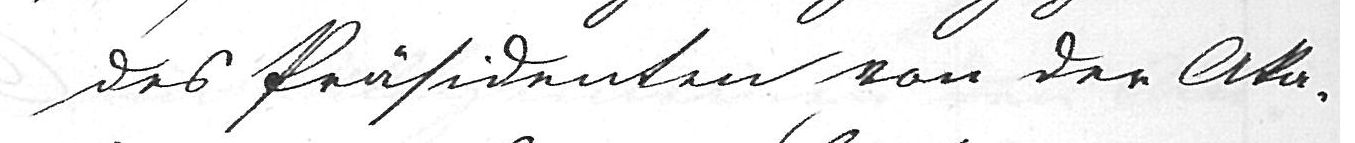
des Präsidenten von der Aka-
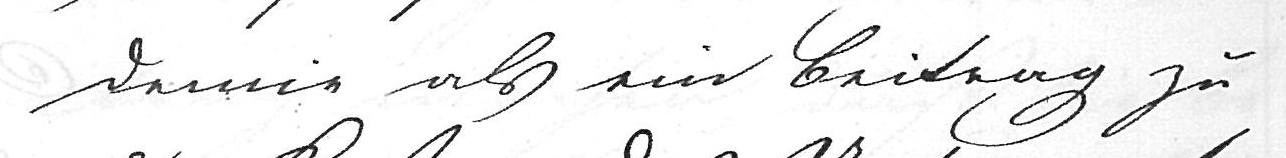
demie als ein Beitrag zu
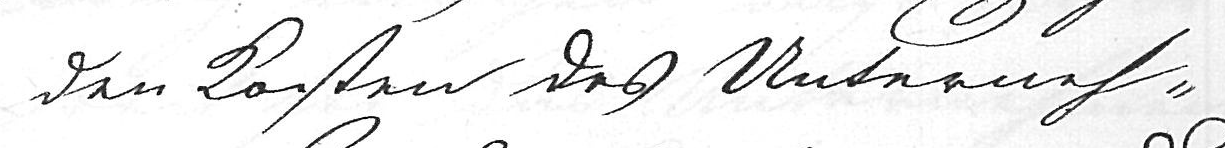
den Kosten des Unterneh-
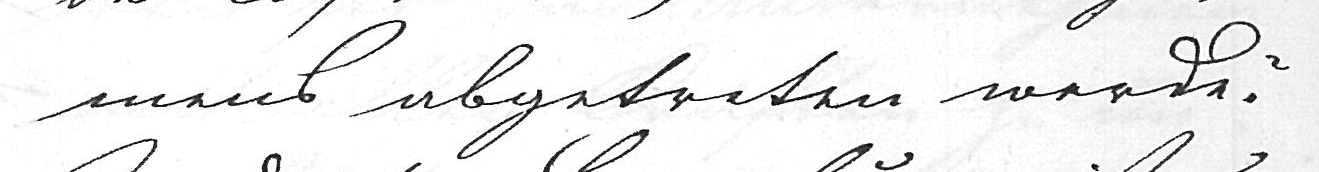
mens abgetreten werde?
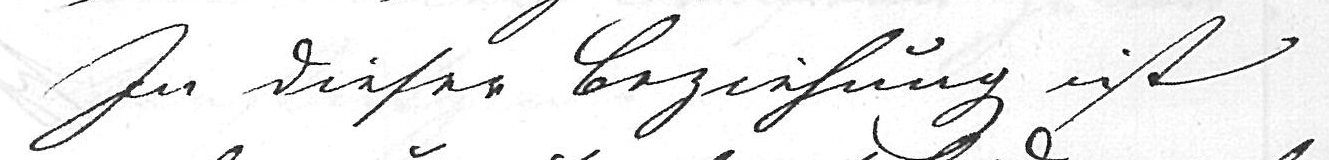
In dieser Beziehung ist
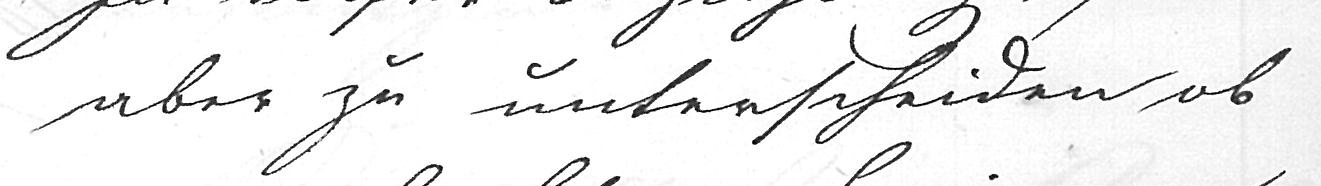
aber zu unterschieden ob
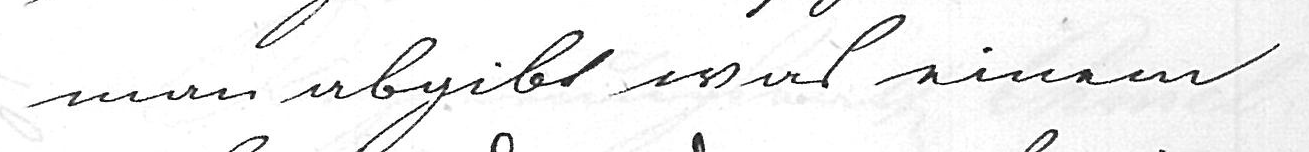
man abgibt was einem
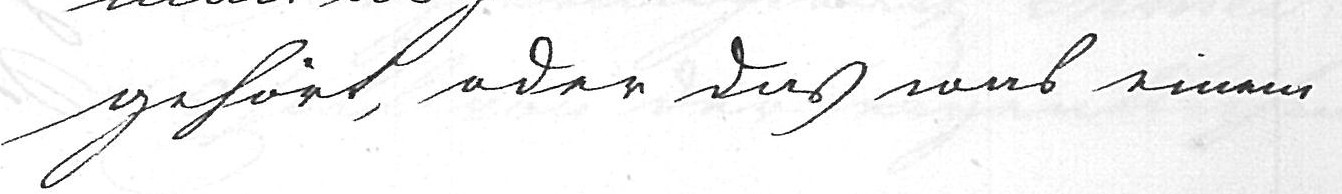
gehört, oder das was einem
